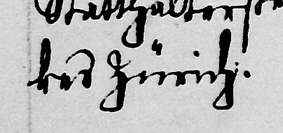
rkes Zürich
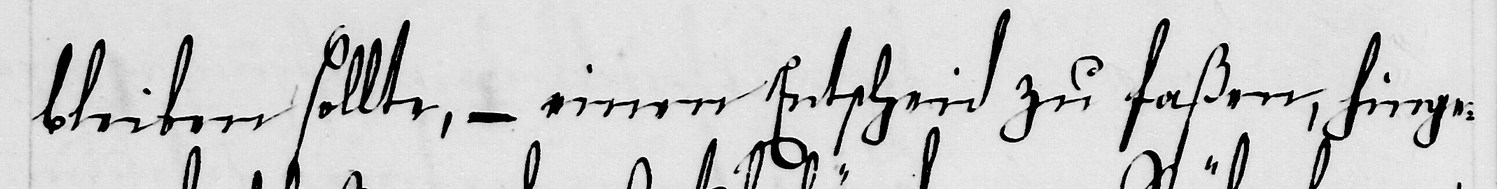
bleiben sollte, – einen Entscheid zu faßen, hinge¬
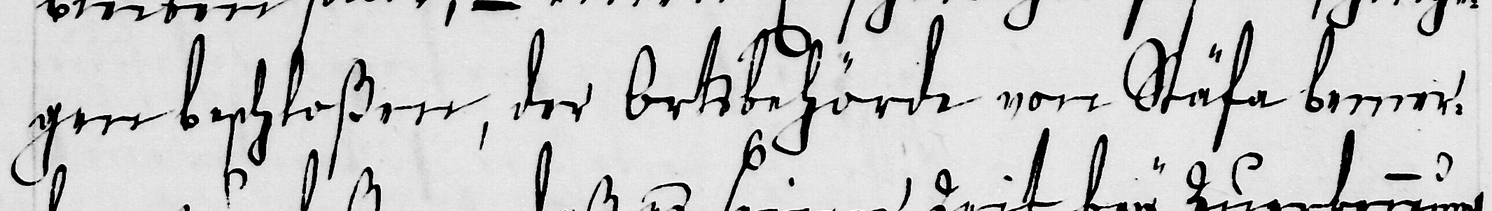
gen beschloßen, der Ortsbehörde von Stäfa bemer¬
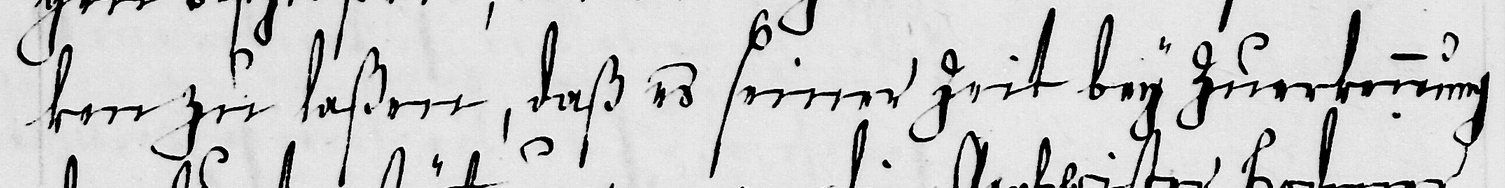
ken zu laßen, daß es seiner Zeit bey Zuerkennung
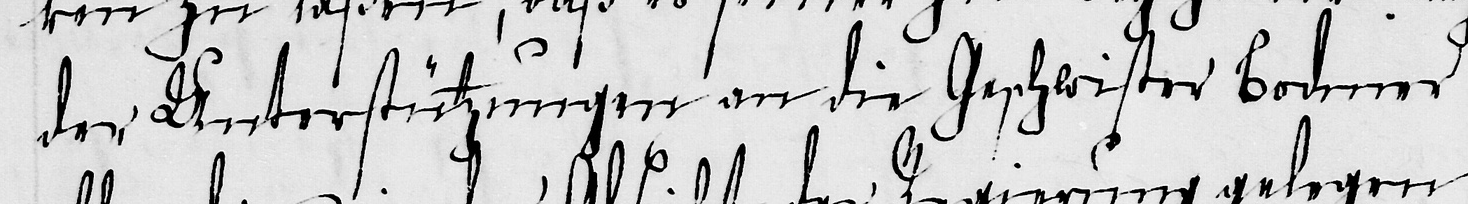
der Unterstützungen an die Geschwister Bodmer
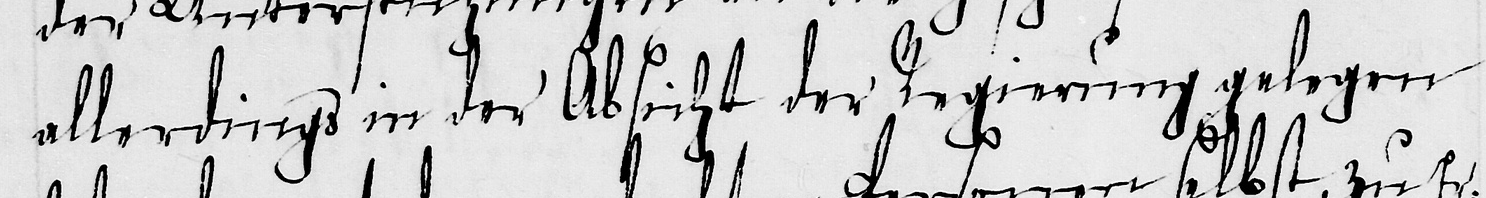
allerdings in der Absicht der Regierung gelegen
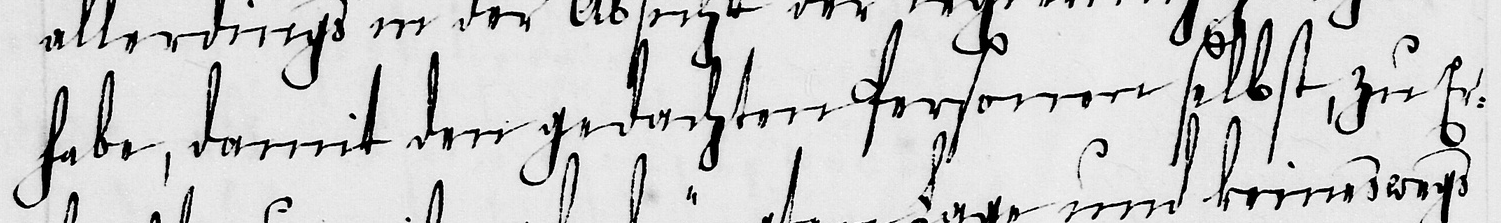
habe, damit den gedachten Personen selbst, zu Er¬
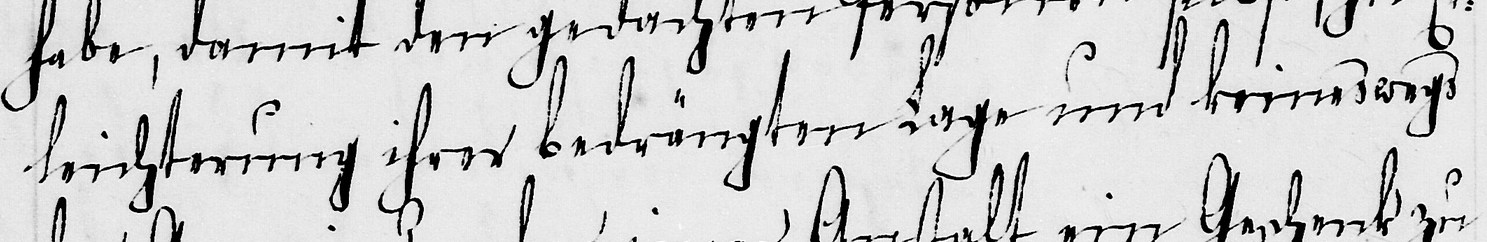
leichterung ihrer bedrängten Lage und keineswegs
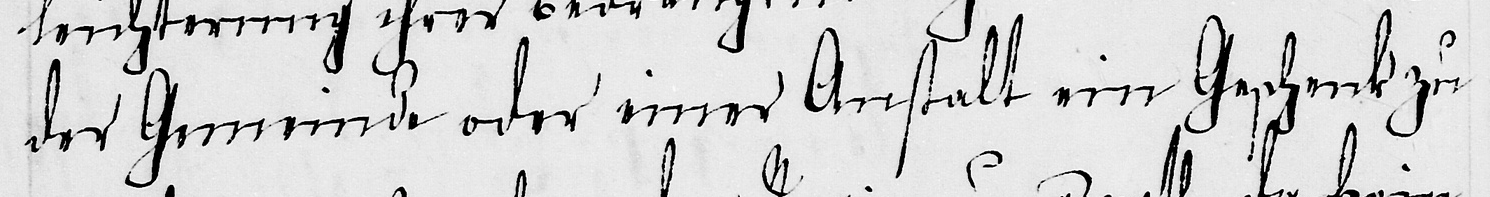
der Gemeinde oder einer Anstalt ein Geschenk zu
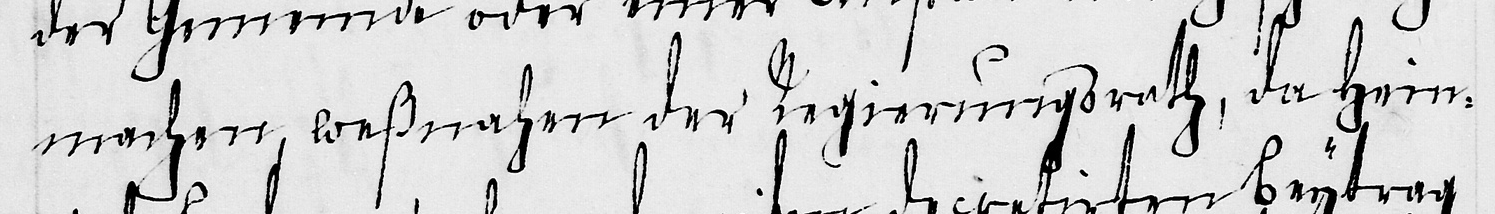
machen, weßnahen der Regierungsrath, da Hein¬
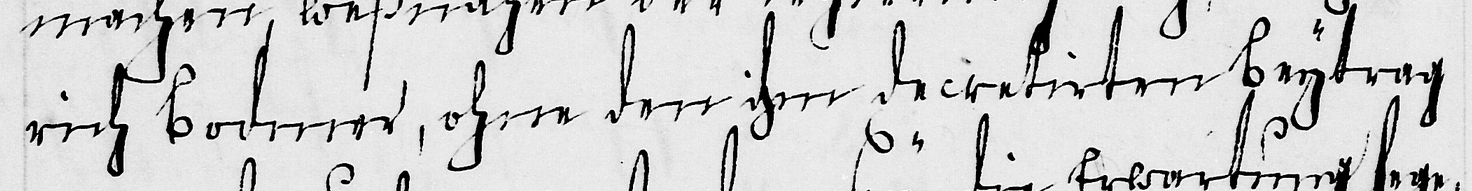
rich Bodmer, ohne den ihm decretirten Beytrag
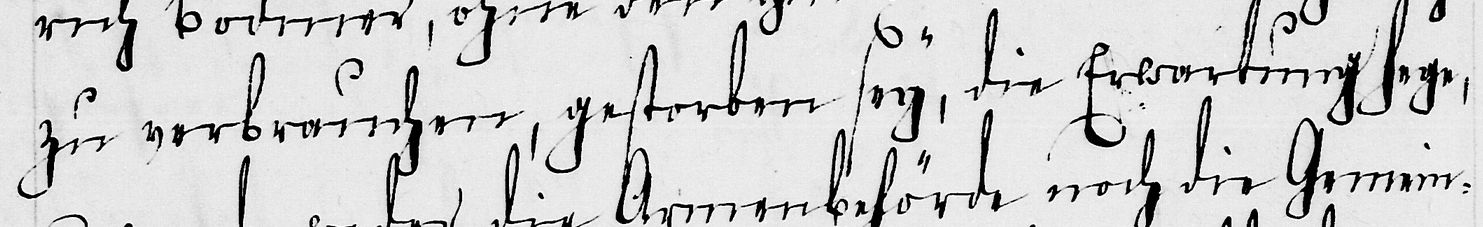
zu verbrauchen, gestorben sey, die Erwartung lege,
